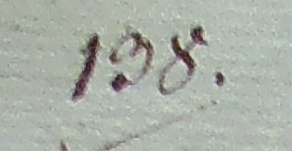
138.
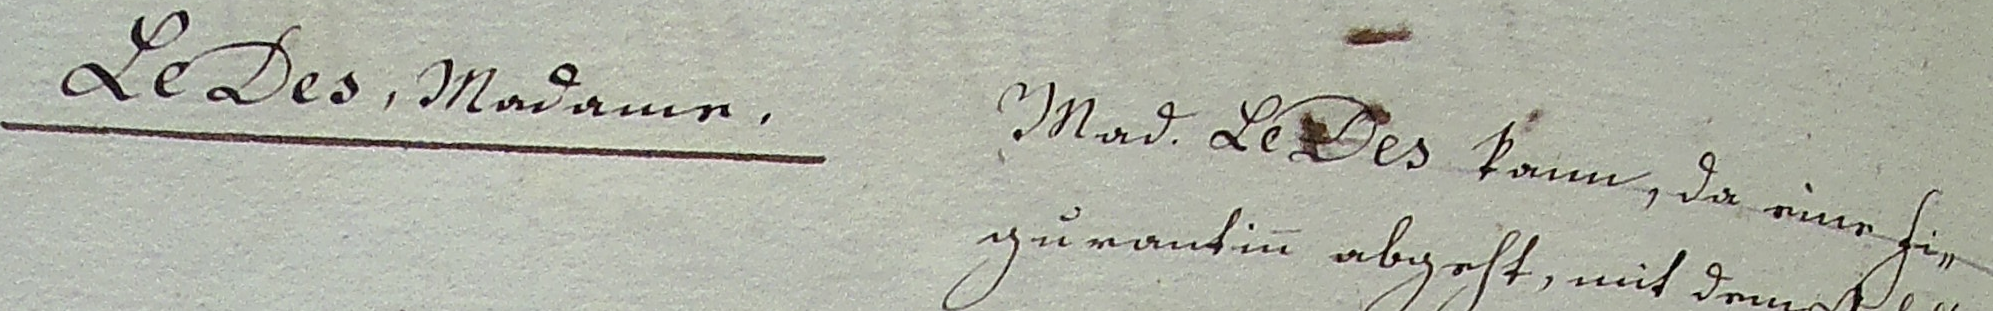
Le Des, Madame. Mad. Le Des kann, da eine Fi¬
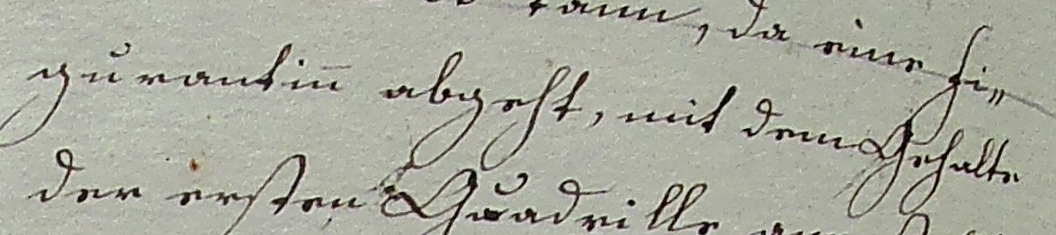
gurantin̅ abgeht, mit dem Gehalte
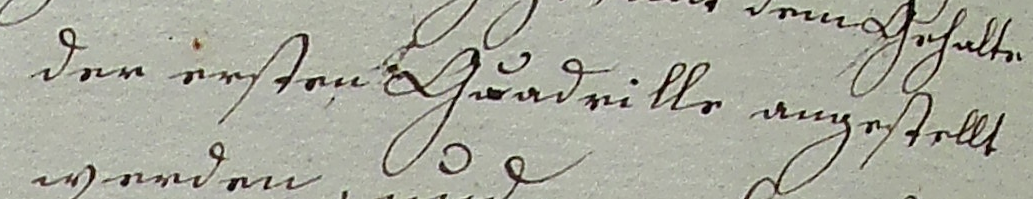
der ersten Quadrille angestellt
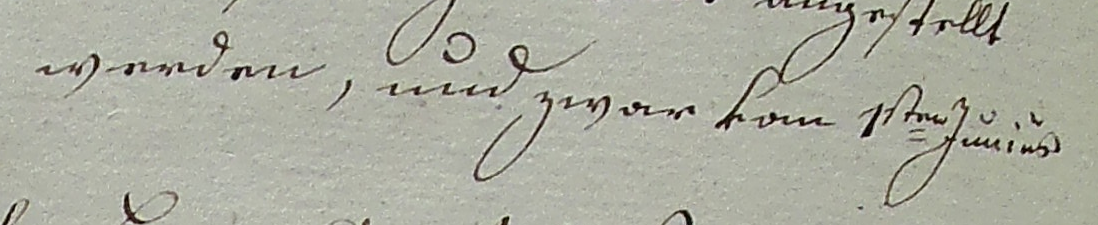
werden, und zwar vom 1ste͇n Junius.
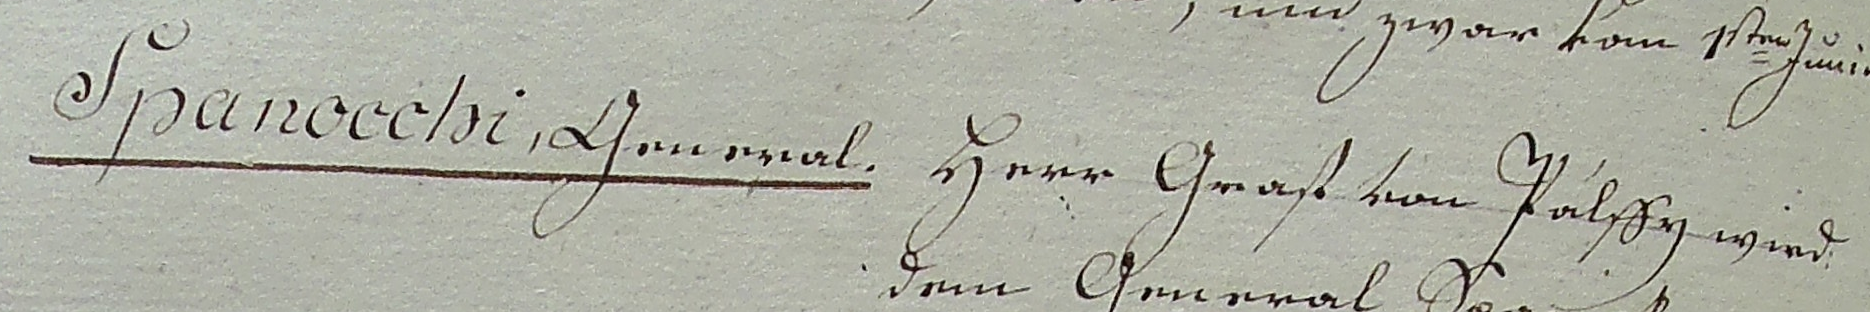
Spanocchi, General. Herr Graf von Pálffy wird
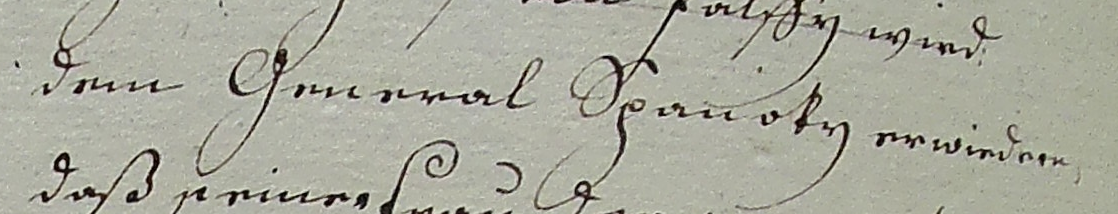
dem General Spanoky erwirdern
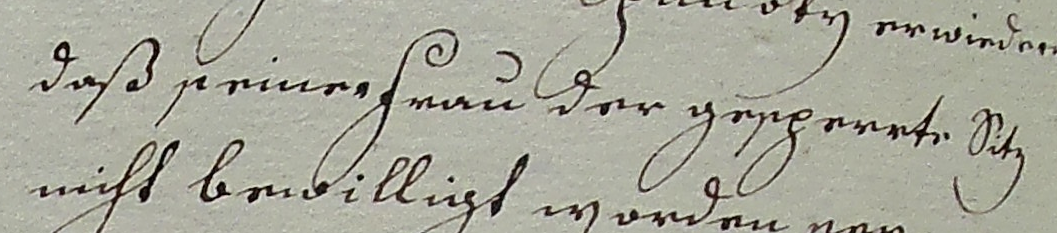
daß seiner Frau der gesperrte Sitz
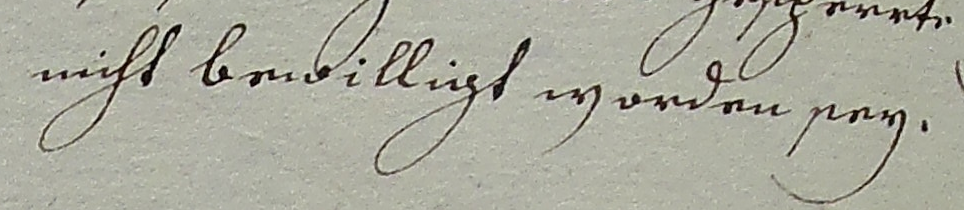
nicht bewilligt worden sey.
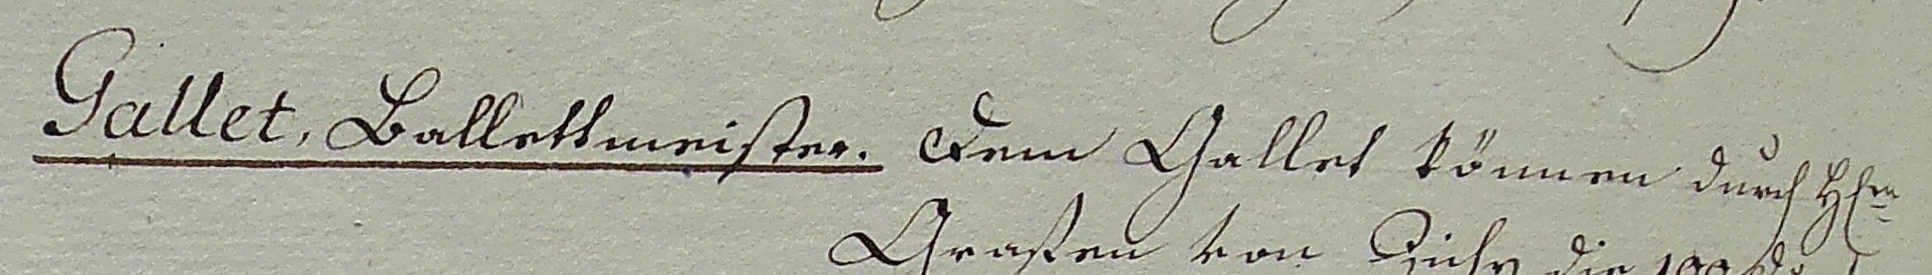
Gallet, Ballettneister. Dem Gallet können durch HEr͇n
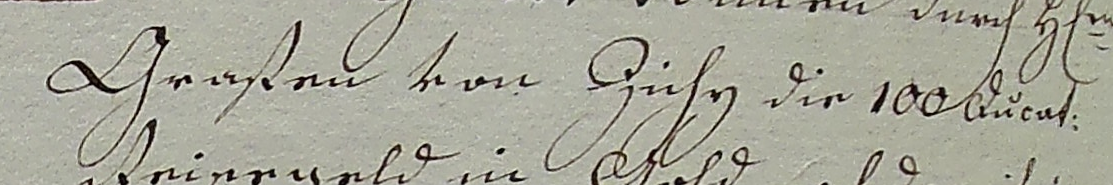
Grafen von Zichy die 100 Ducat.
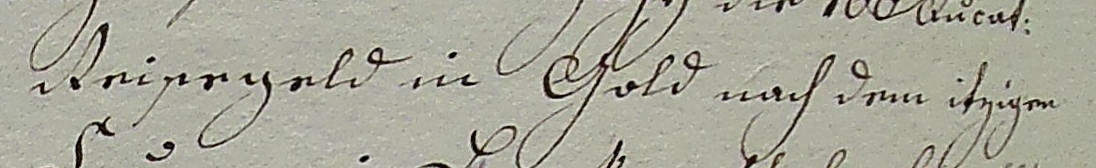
Reisegeld in Gold nach dem itzigen
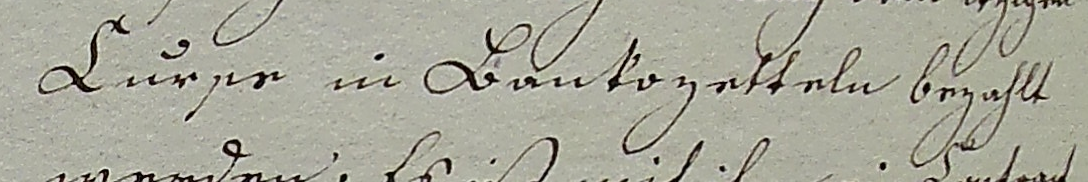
Curse in Bankozetteln bezahlt
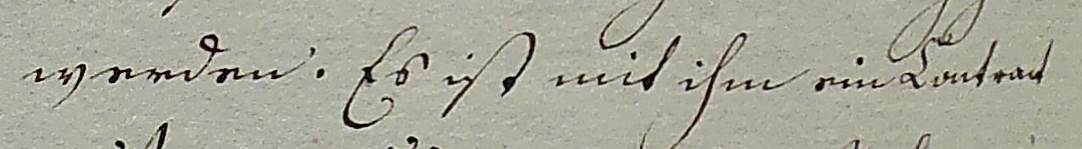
werden. Es ist mit ihm ein Contract
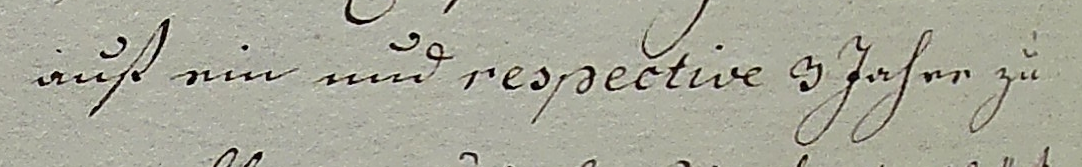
auf ein und respective 3 Jahre zu
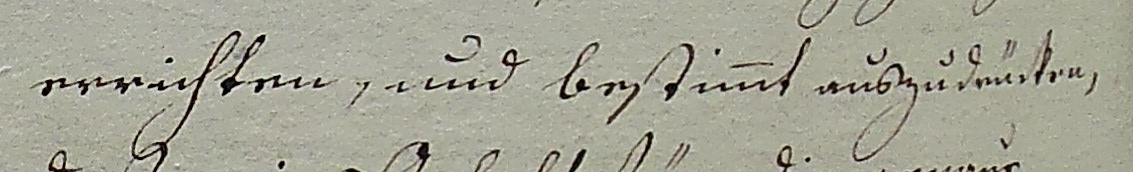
errichten, und bestim̅t auszudrücken,
